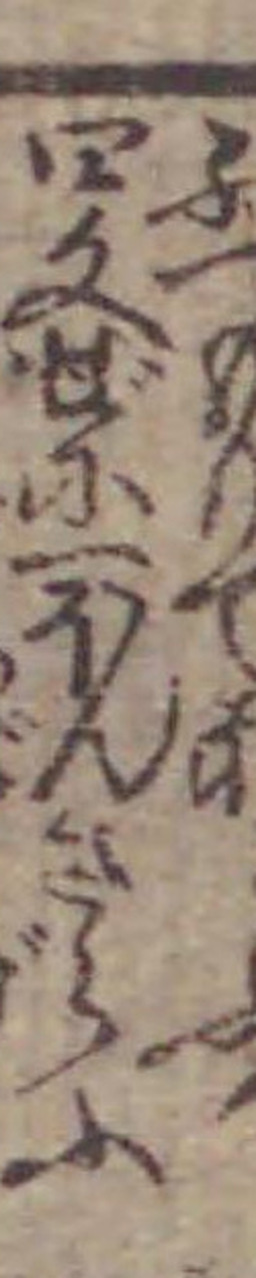四文ぜに一ほんさらふ
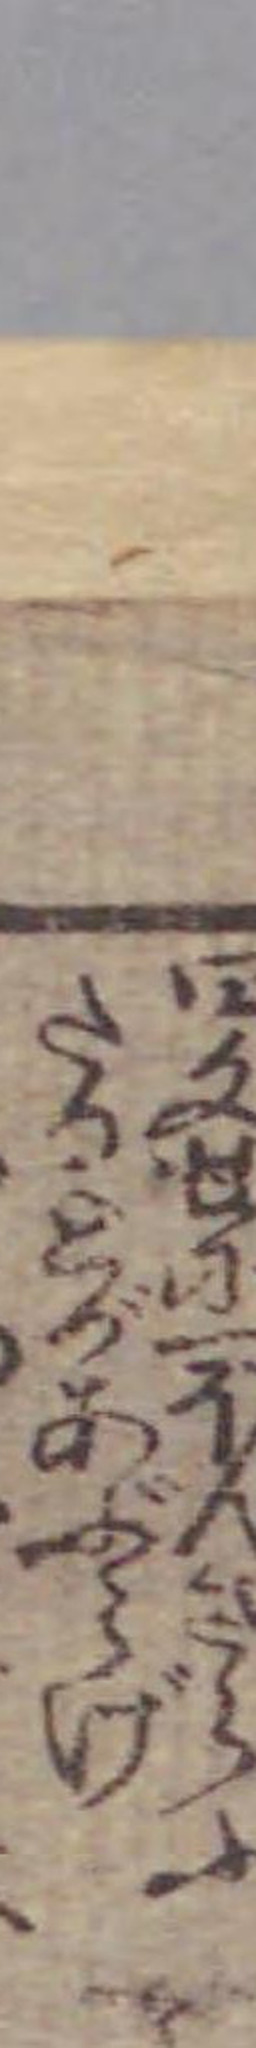たるとがあぶらげ
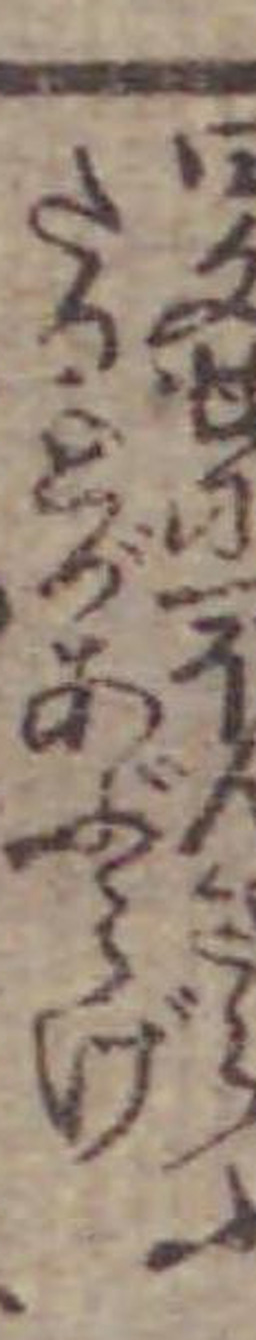たるとがあぶらげ
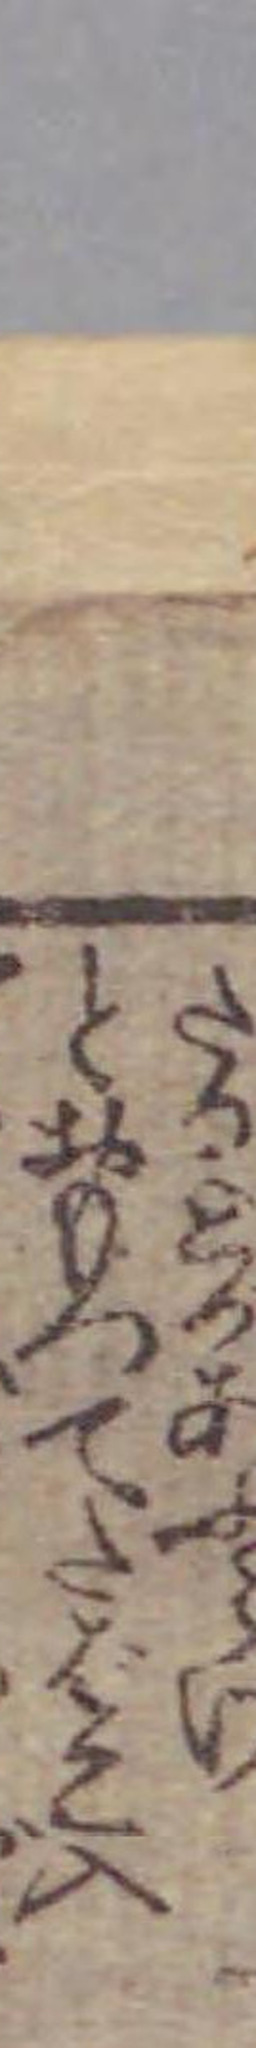とおもつてたばこ入
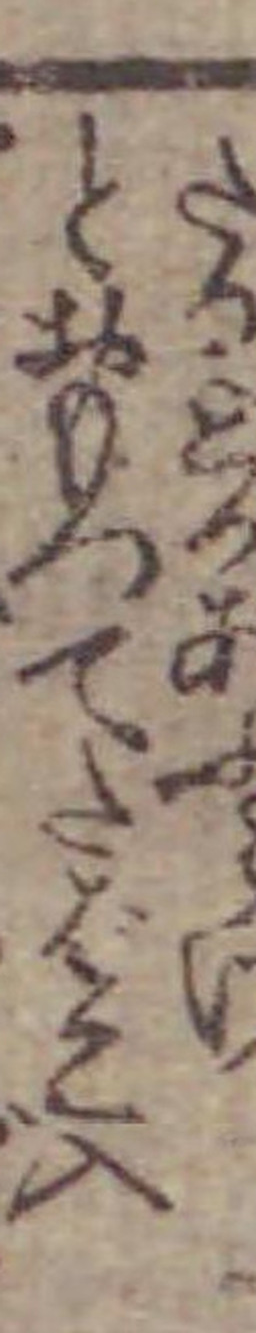とおもつてたばこ入
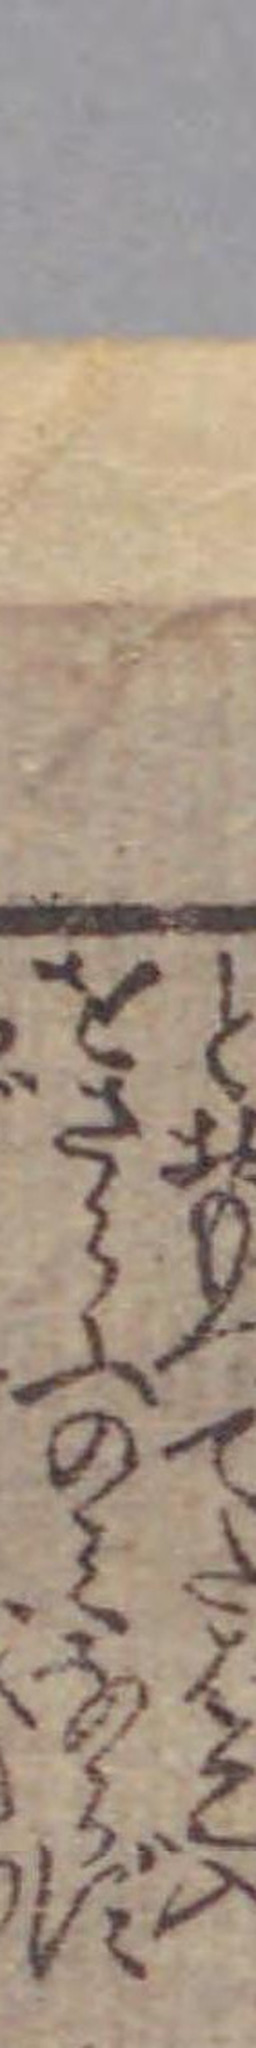をさらふのみならず
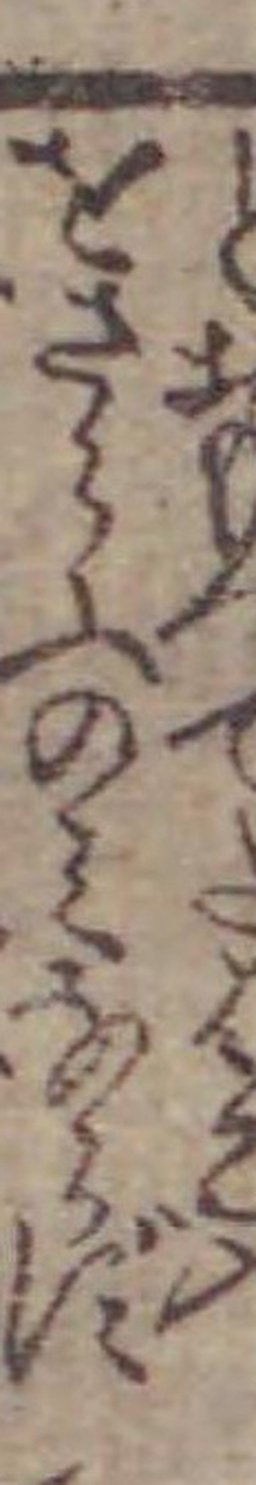をさらふのみならず
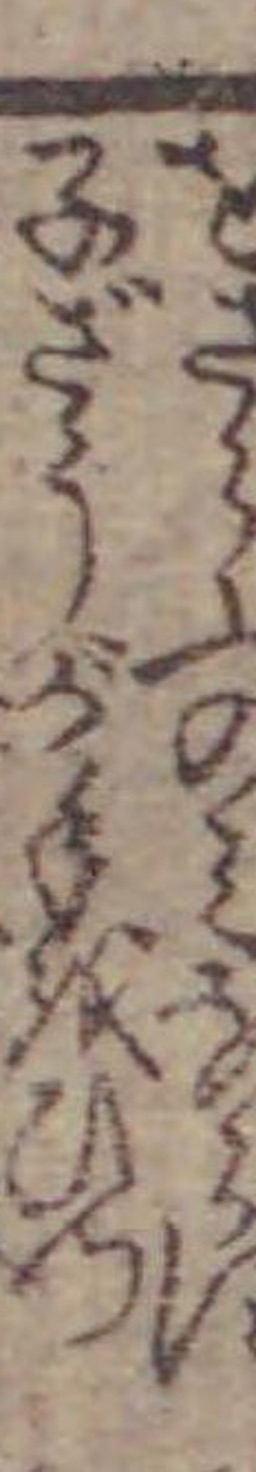子ざうが手をひつ
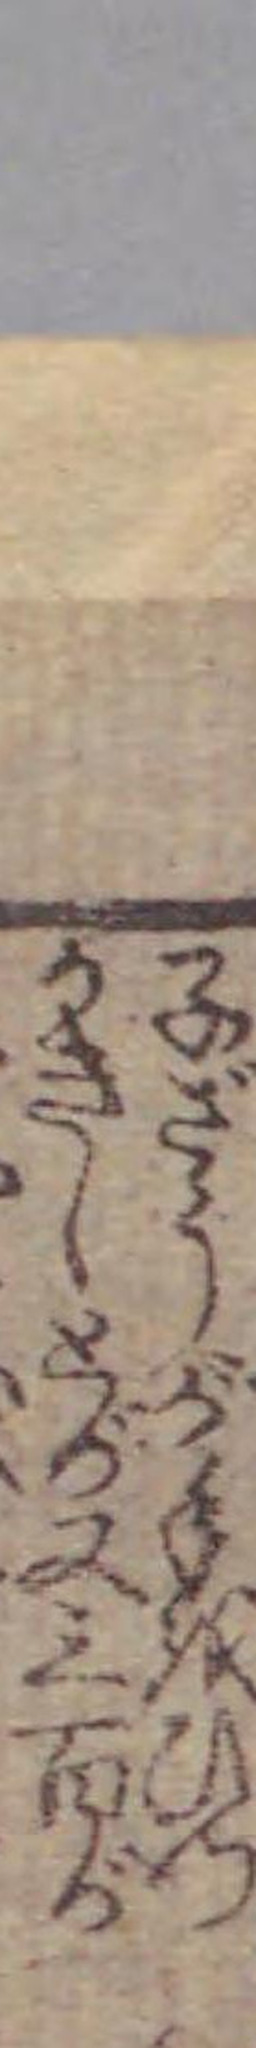かきしとが又三百が
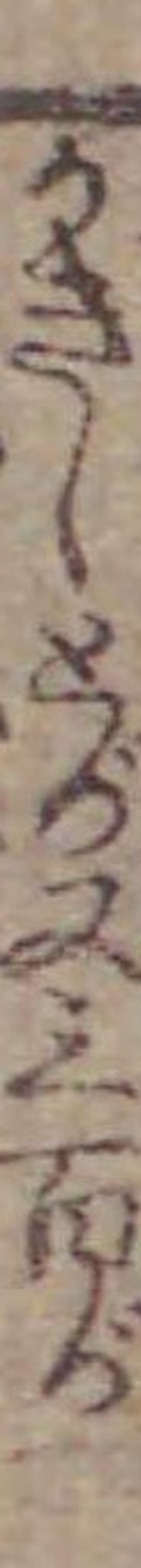かきしとが又三百が
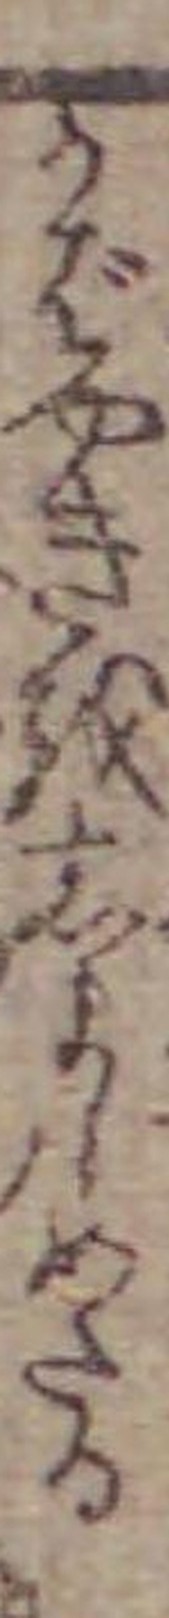かばやきをしよしめたる
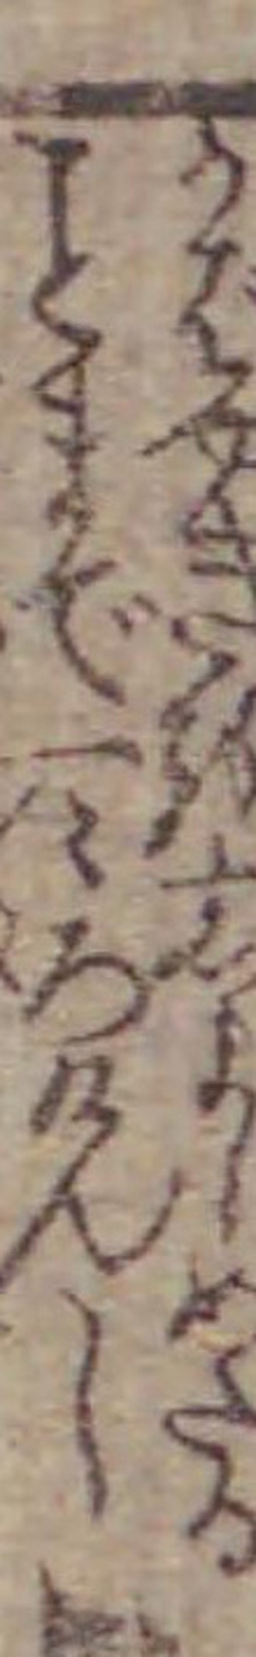ことまで一々ろけんし
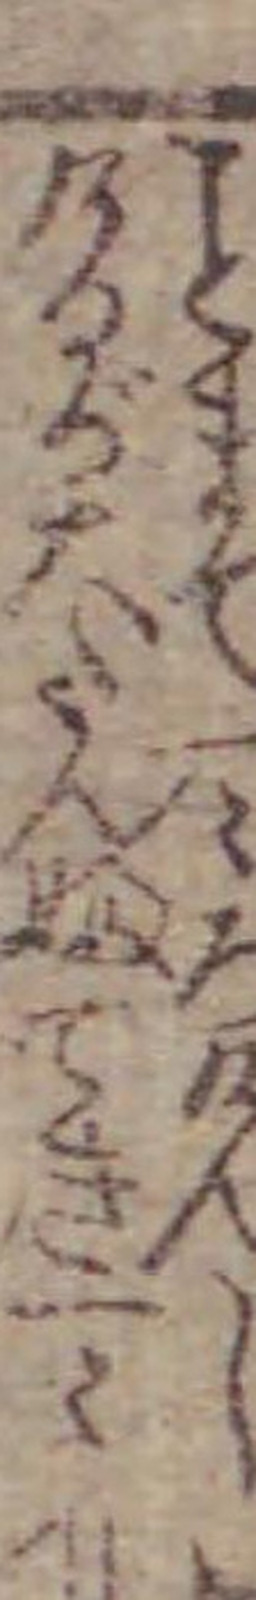けるが大たんふてき一々
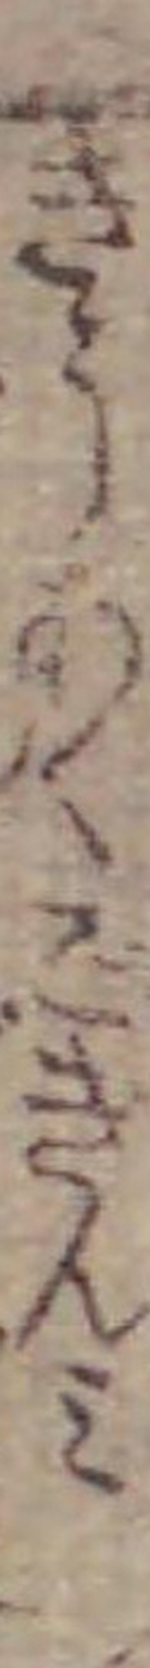きうあくごぎんみ
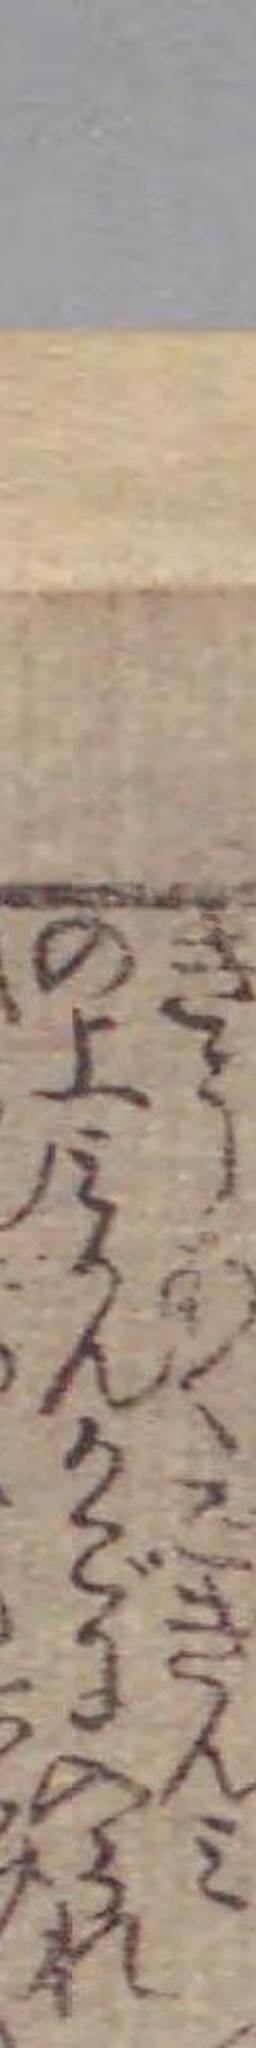の上みかんかごに入かれ
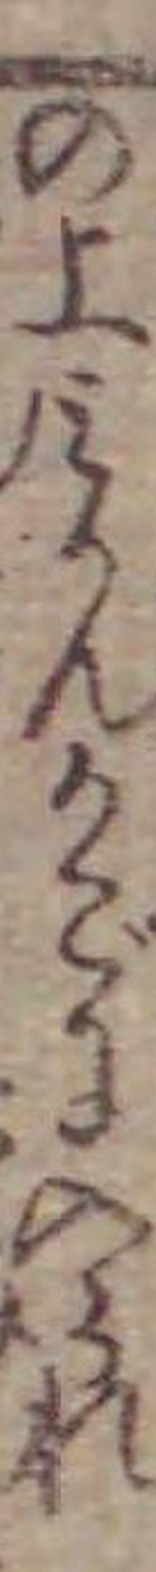の上みかんかごに入かれ
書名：即席耳学問 : 3巻
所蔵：国立国会図書館 National Diet Library, JAPAN
